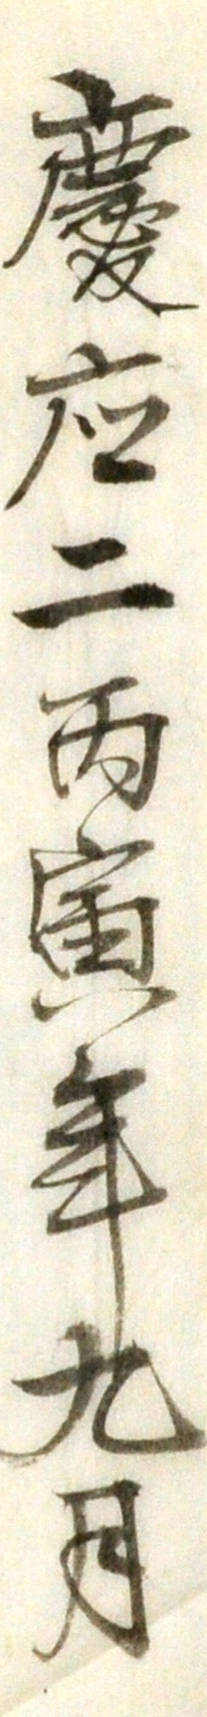慶応二丙寅年九月
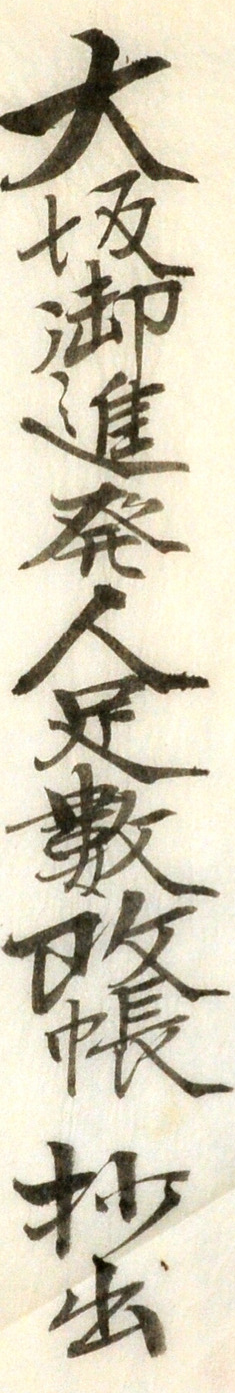大坂御進発人足数改帳抄出

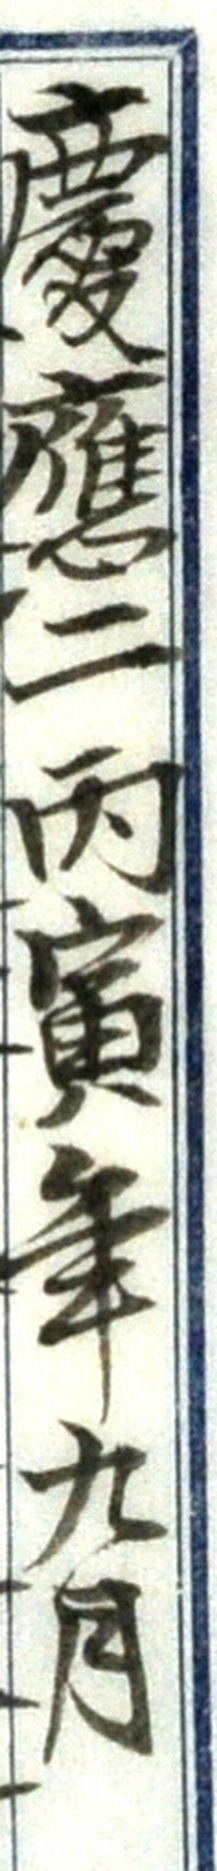慶応二丙寅年九月
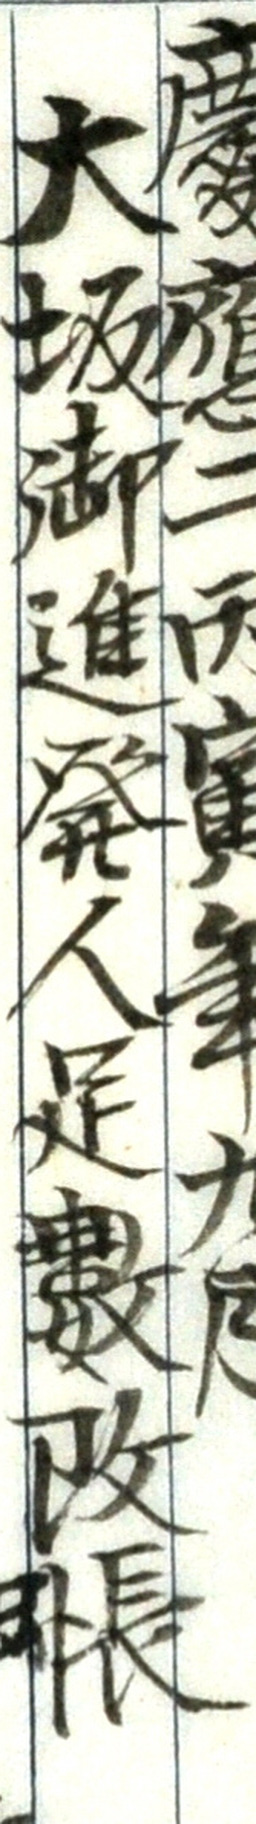大坂御進発人足数改帳
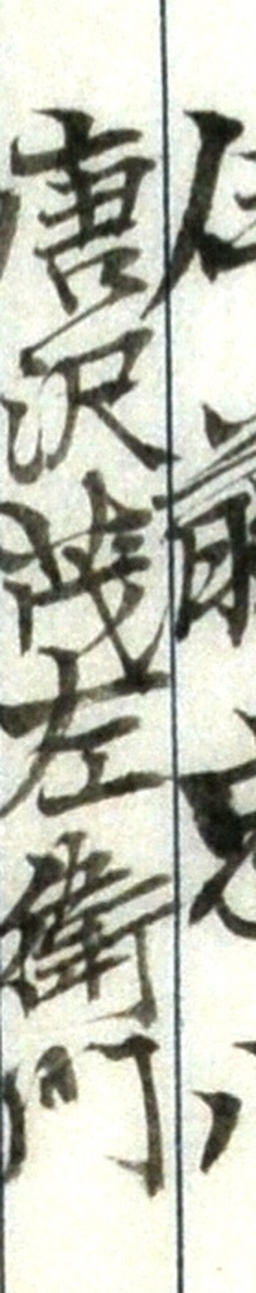唐沢茂左衛門
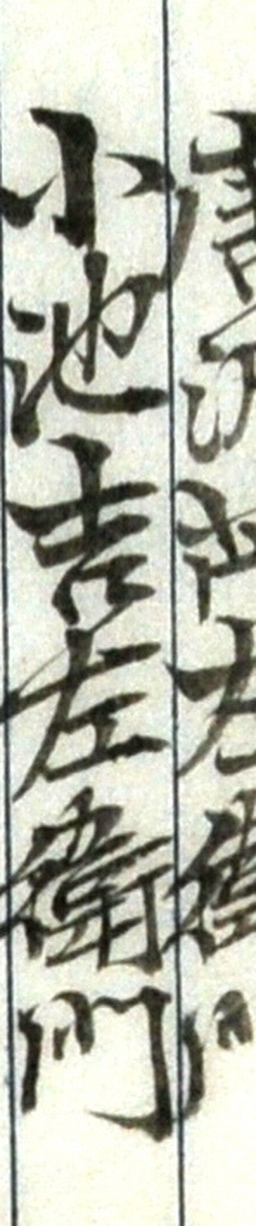小池吉左衛門
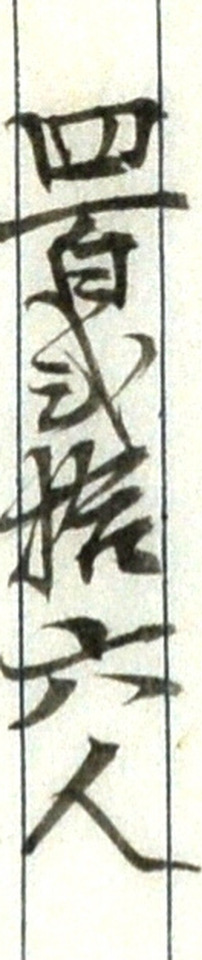弐百弐拾四人
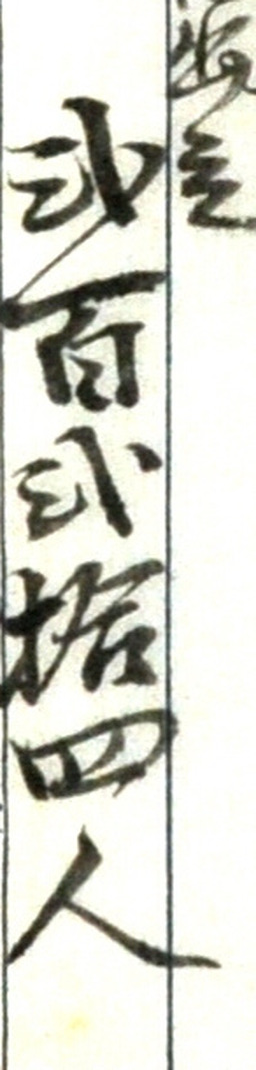弐百弐拾四人

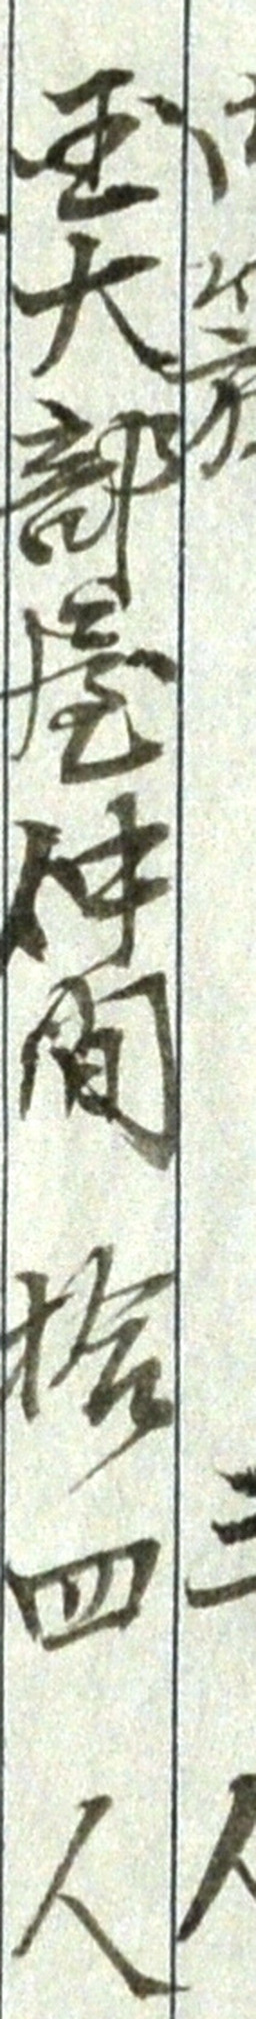国大部屋仲間拾四人
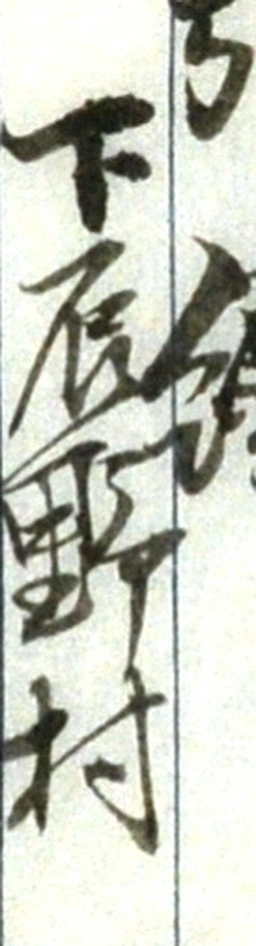下辰野村
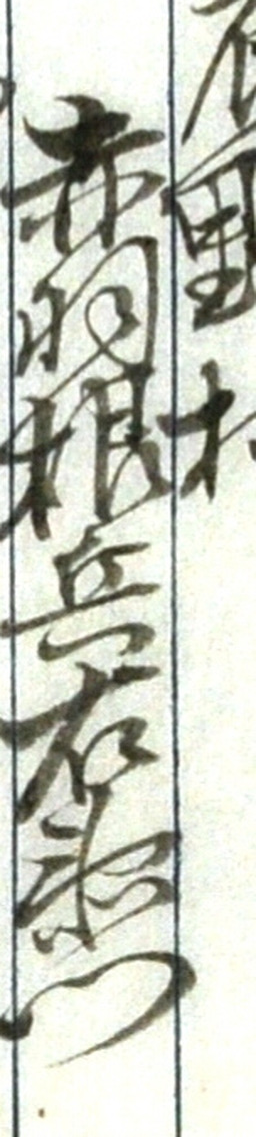赤羽根兵右衛門
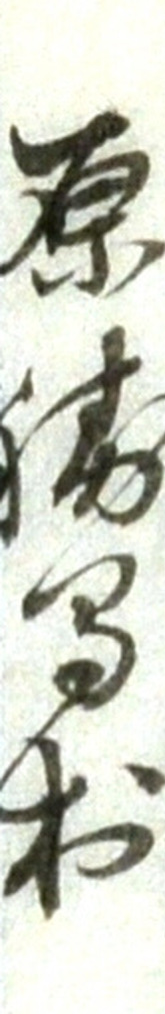原勝間村
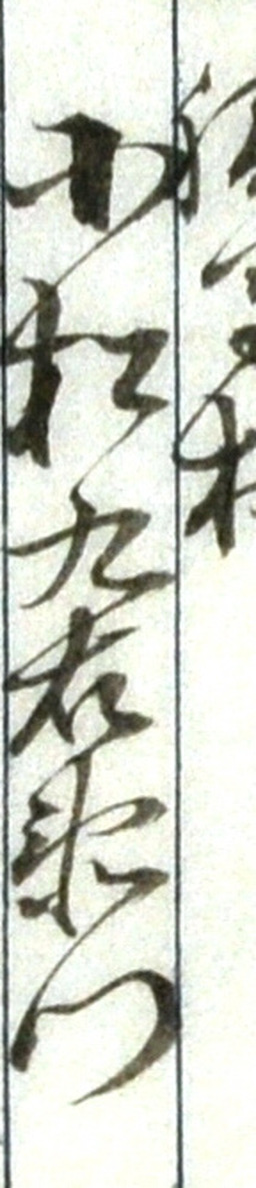小松九右衛門
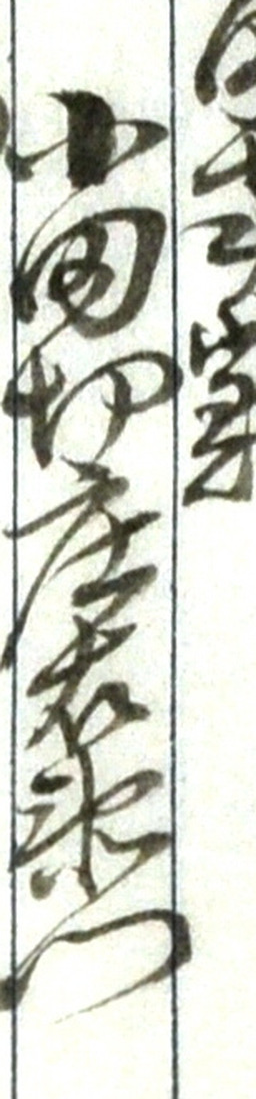小田切庄右衛門
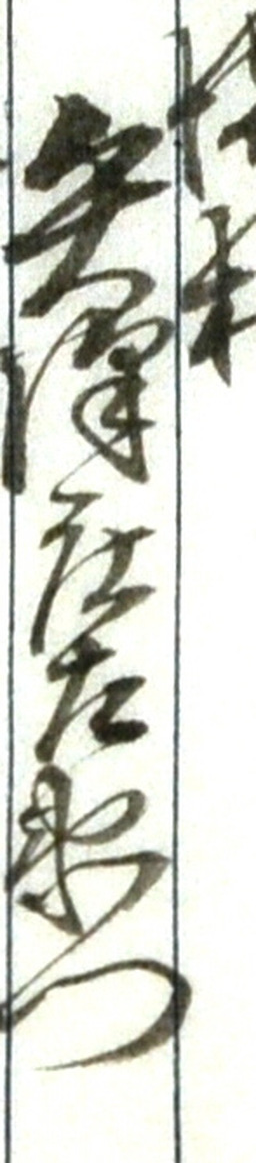矢沢庄右衛門
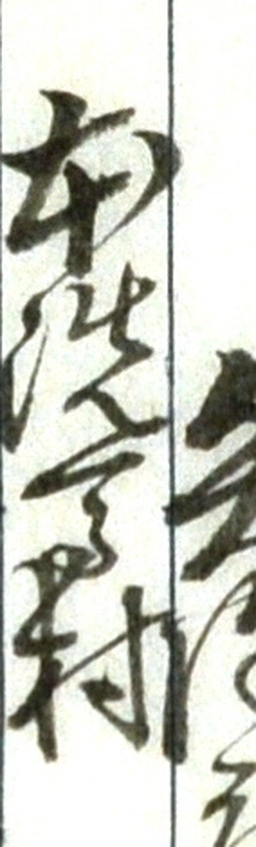本洗馬村
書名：大阪御進初人足数改帳（抄出）
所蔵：伊那市立高遠町図書館・合同会社AMANE
